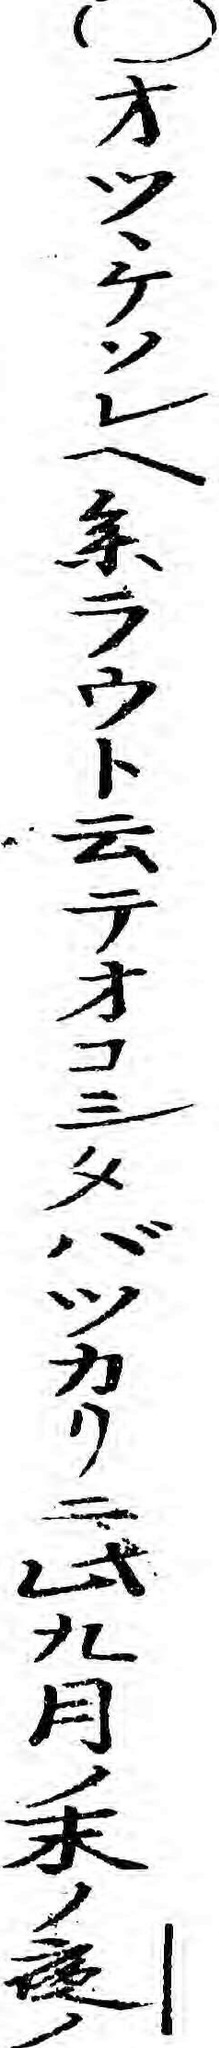○オツヽケソレヘ参ラウト云テオコシタバツカリニ此九月ノ末ノ夜ノ
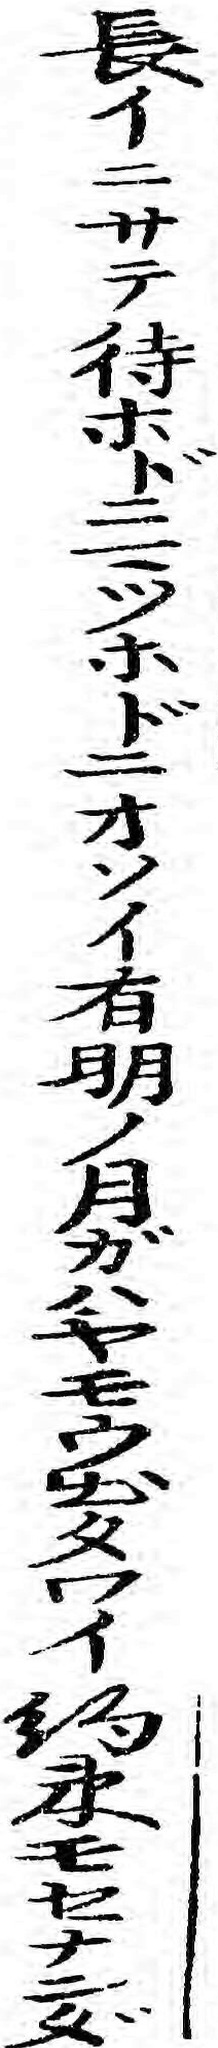長イニサテ待ホドニマツホドニオソイ有明ノ月ガハヤモウ出タワイ約束モセナンダ
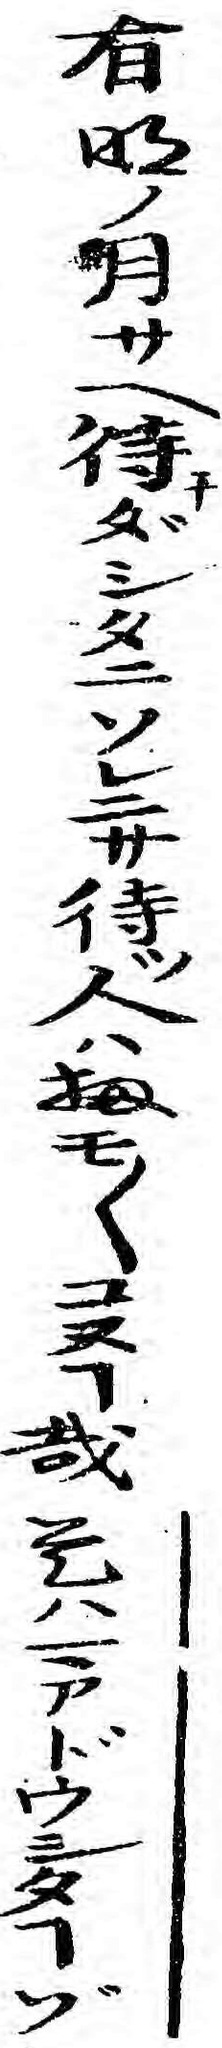有明ノ月サヘ待チダシタニソレニサ待ツ人ハ扨モ〳〵コヌコト哉是ハマアドウシタコトゾ
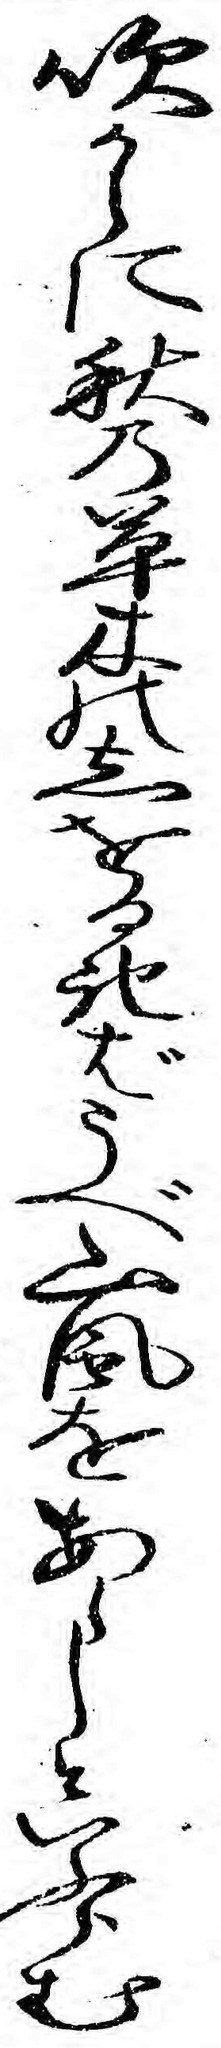吹からに秋の草木のしをるればうべ山風をあらしといふらむ
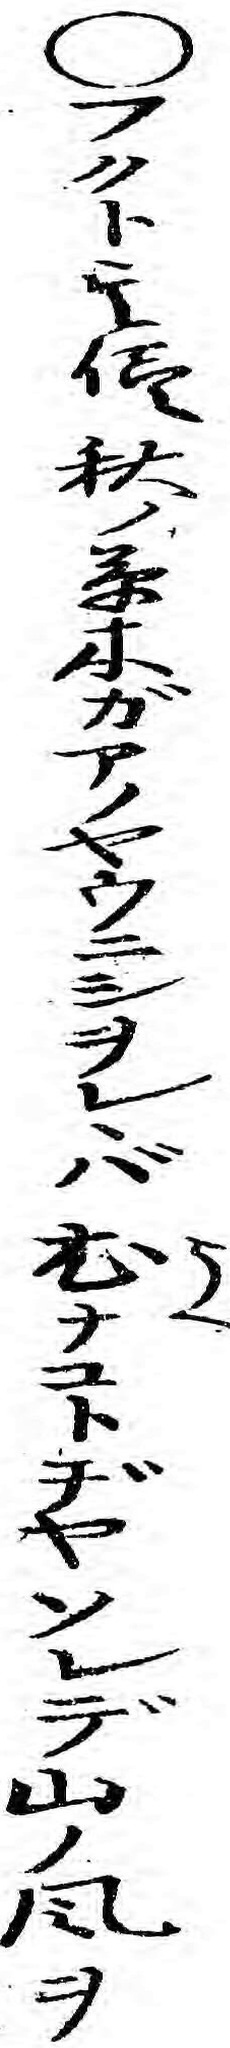○フクト其侭秋ノ草木ガアノヤウニシヲレヽバ尤ナコトヂヤソレデ山ノ風ヲ
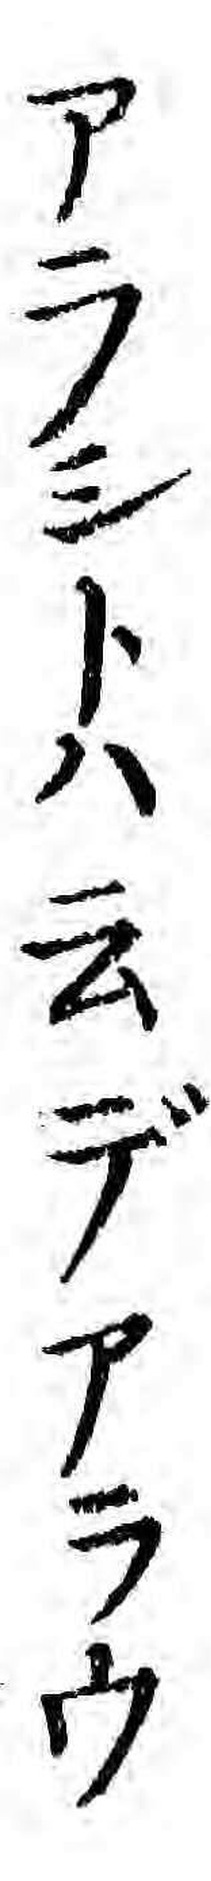アラシトハ云デアラウ

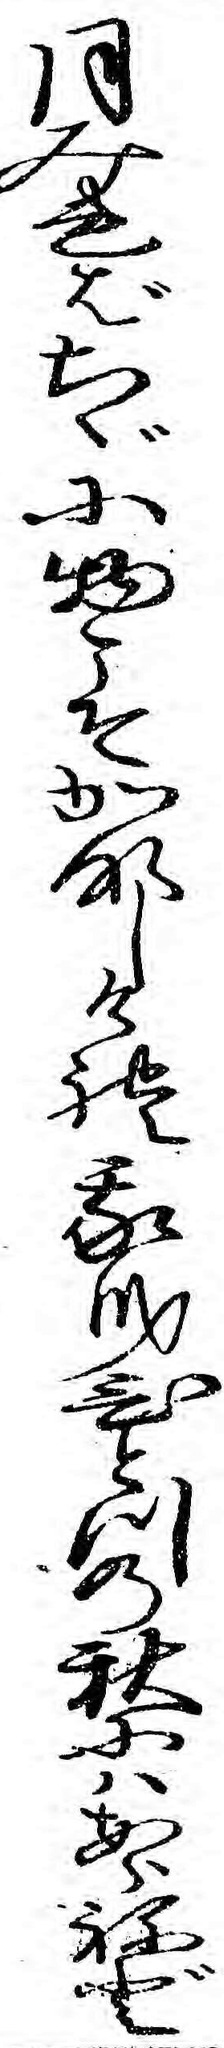月みればちゞに物こそかなしけれ我身ひとつの秋にはあらねど
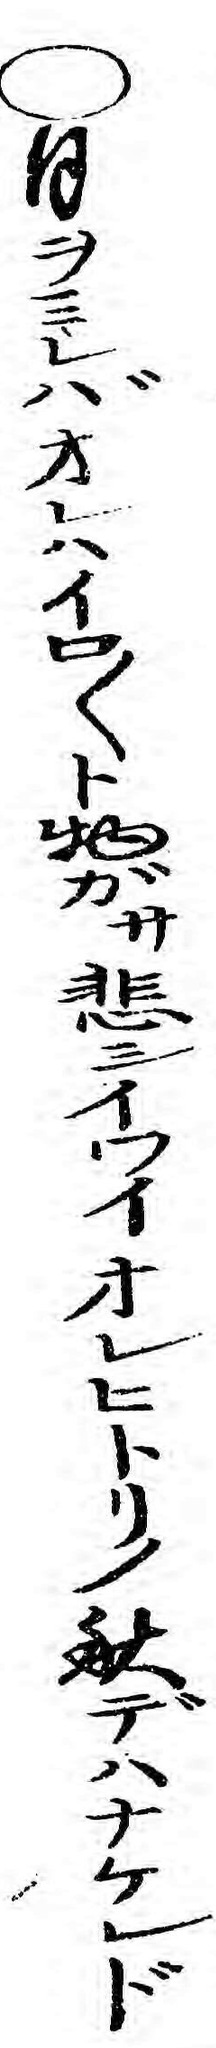○月ヲミレバオレハイロ〳〵ト物ガ悲シイワイオレヒトリノ秋デハナケレド
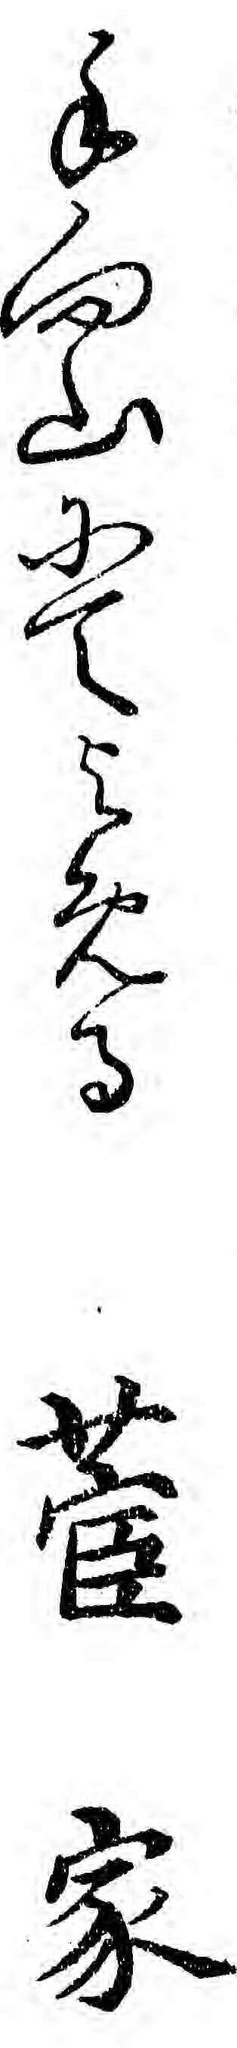手向山にてよめる菅家
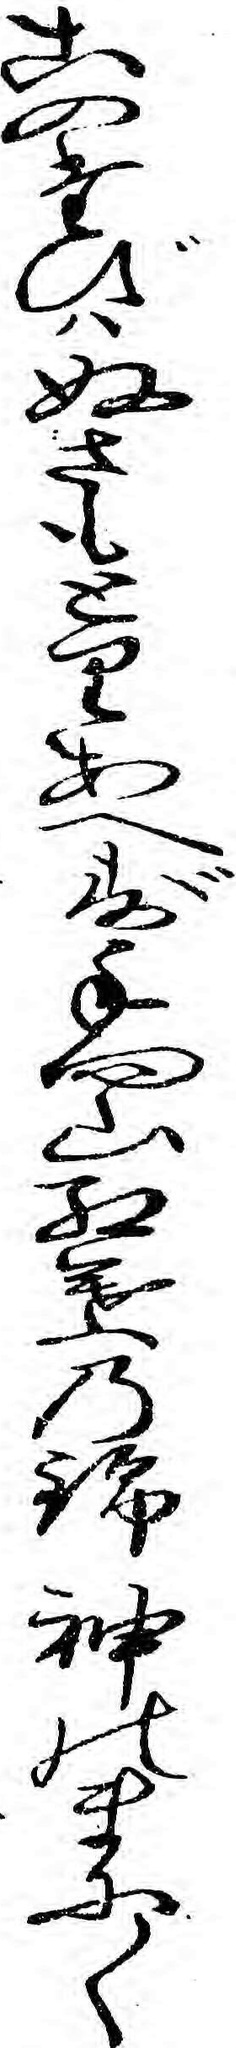このたびはぬさもとりあへず手向山紅葉の錦神のまに〳〵
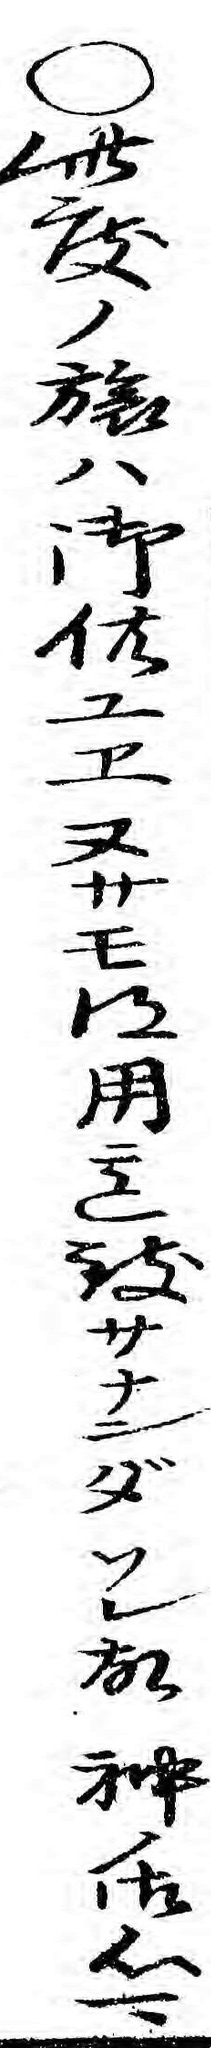○此度ノ旅ハ御供ユヱヌサモえ用意致サナンダソレ故神ノ御心マ
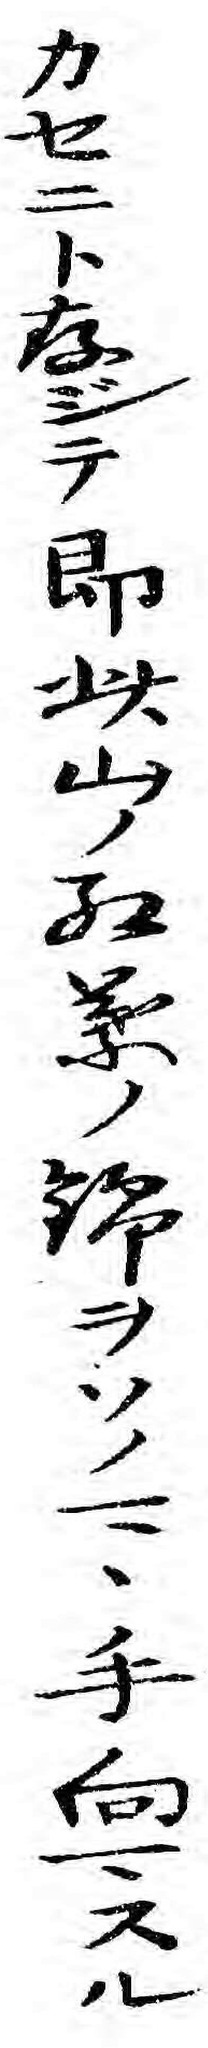カセニト存ジテ即此山ノ紅葉ノ錦ヲソノマヽ手向マスル
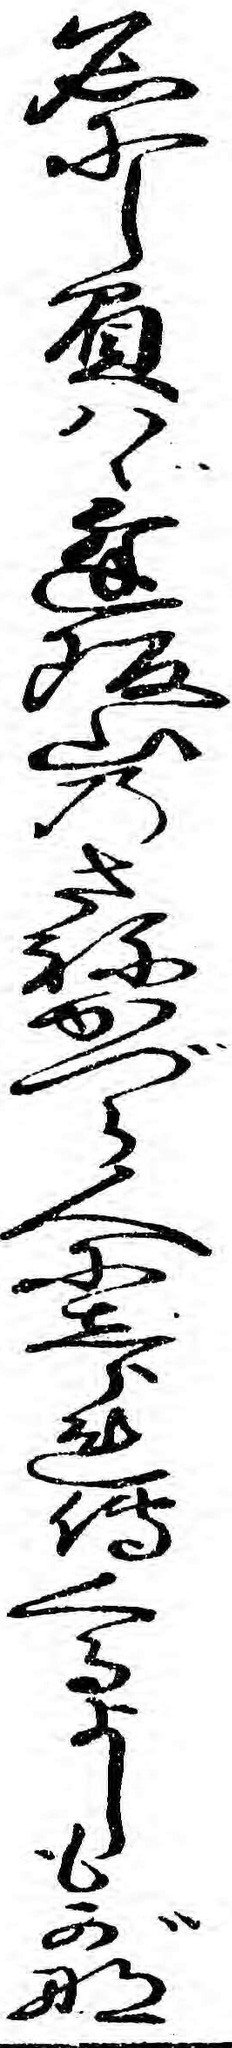名にし負はゞ逢坂山のさねかづら人にしられでくるよしもがな
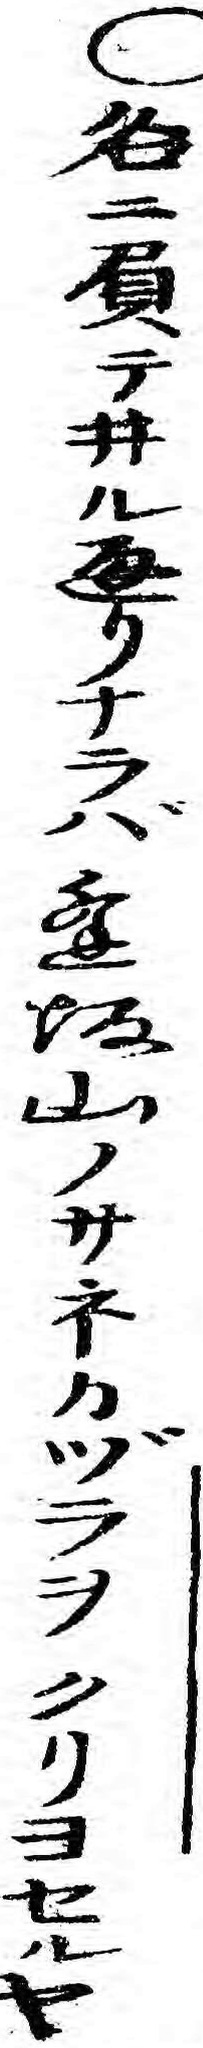○名ニ負テヰル通リナラバ逢坂山ノサネカヅラヲクリヨセルヤ
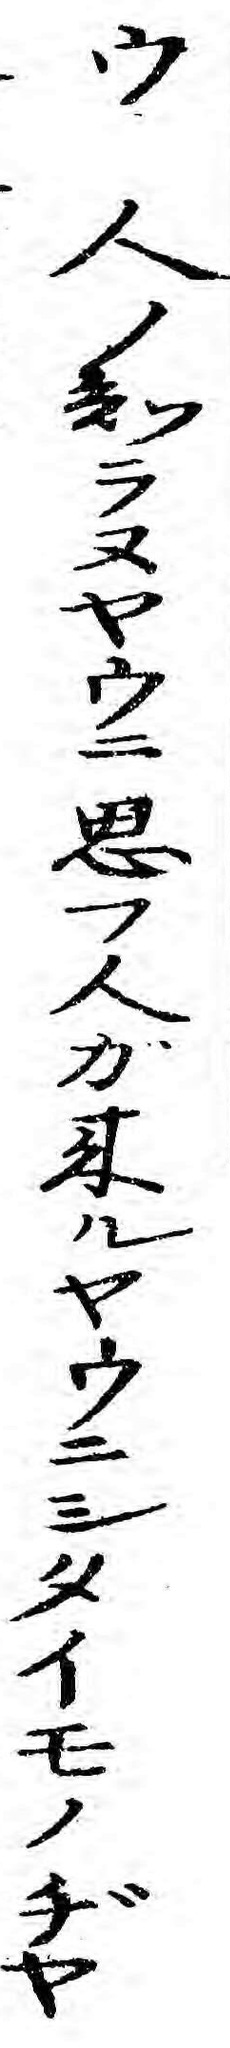ウ人ノ知ラヌヤウニ思フ人ガ来ルヤウニシタイモノヂヤ
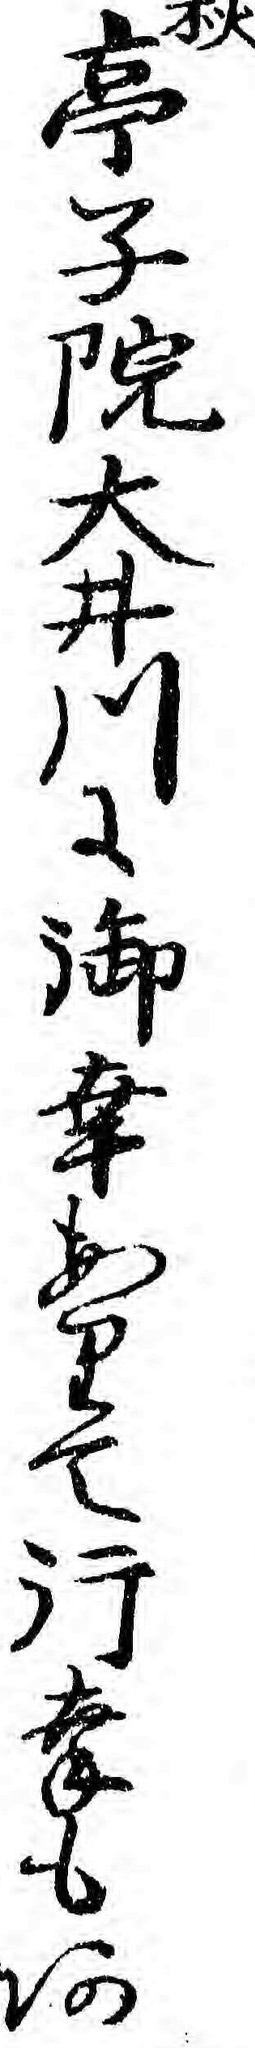拾遺集雑秋亭子院大井川に御幸ありて行幸もあ
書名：百人一首／小倉の山ふみ
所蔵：国文学研究資料館
